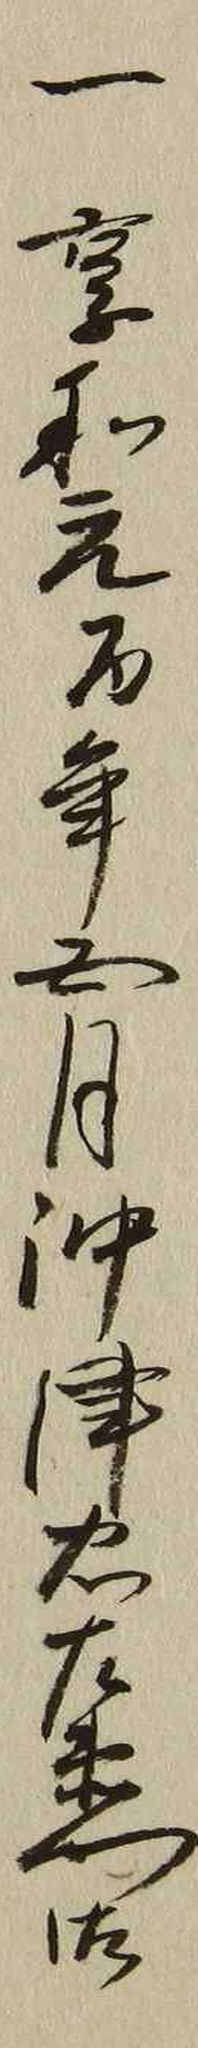一享和元酉年五月沖津忠左衛門御
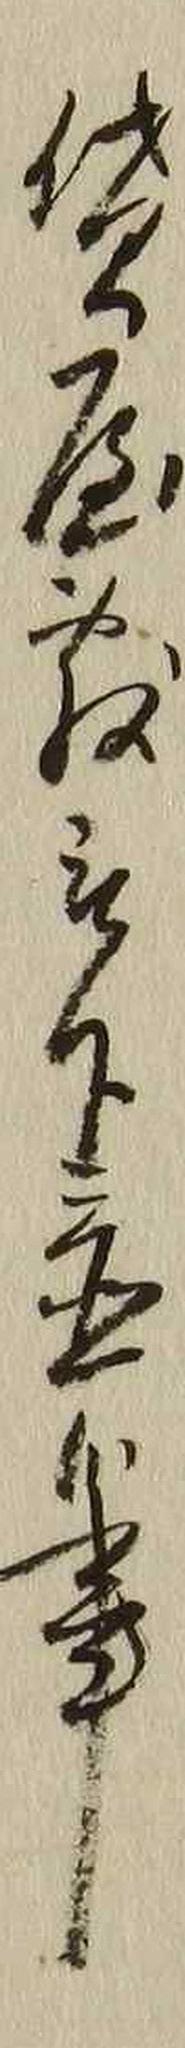貸屋敷被下置候事
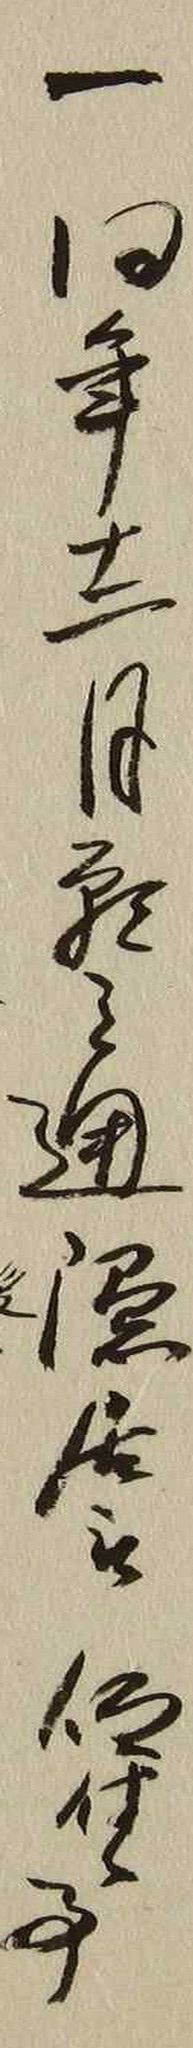一同年十二月願之通隠居被仰付候事
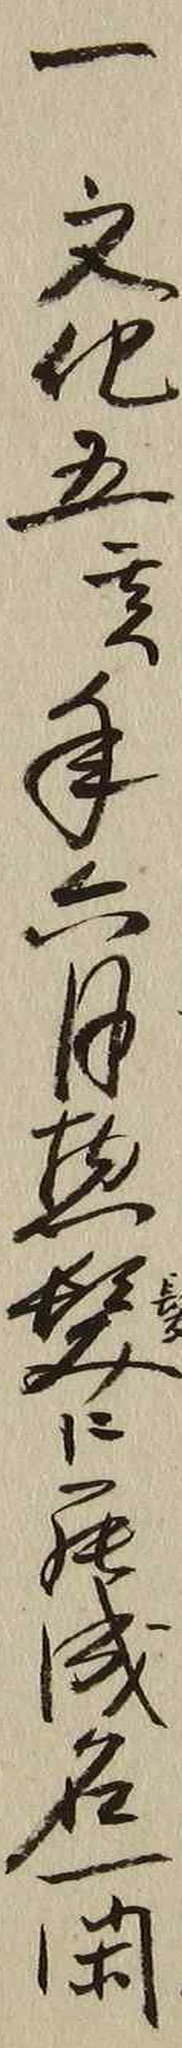一文化五亥年六月惣髪に罷成名一閑
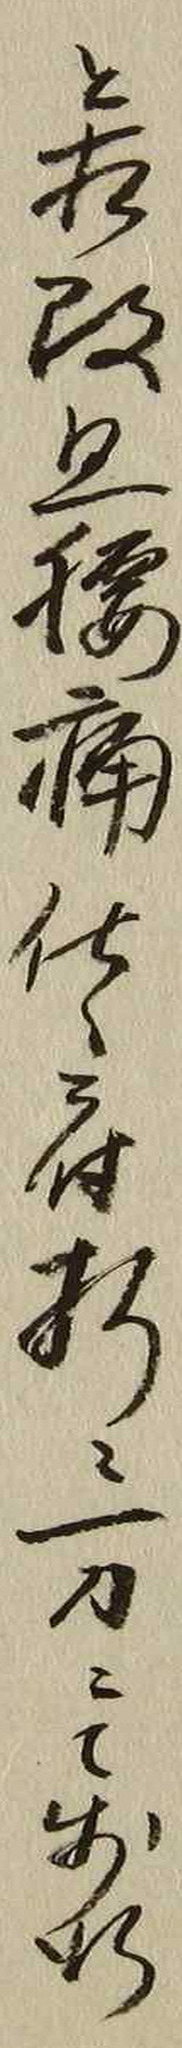と相改且腰痛仕候ニ付折々一刀ニて歩行
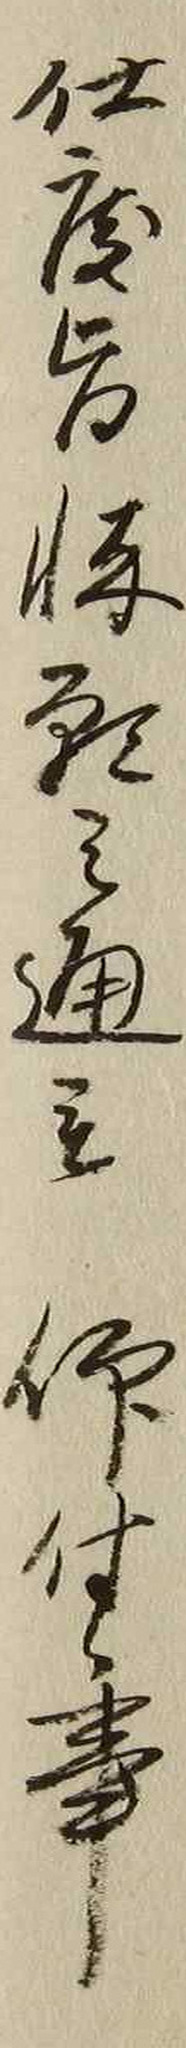仕度旨忰願之通被仰付候事
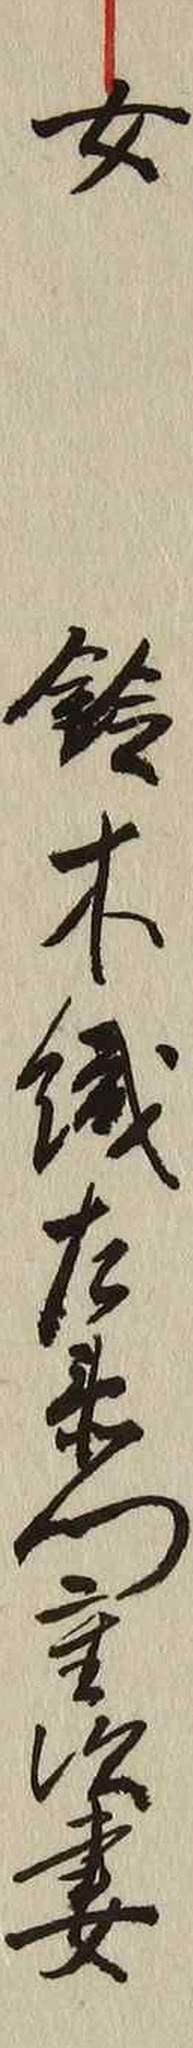女鈴木織左衛門重次妻
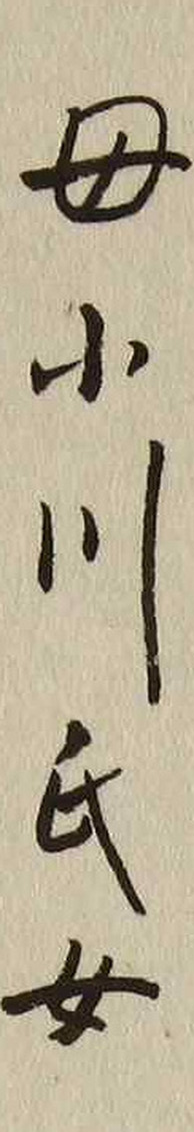母小川氏女
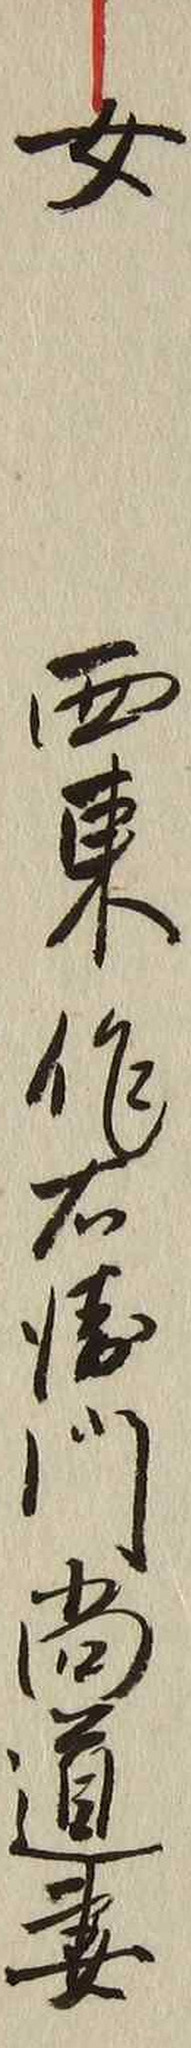女西東作右衛門尚道妻
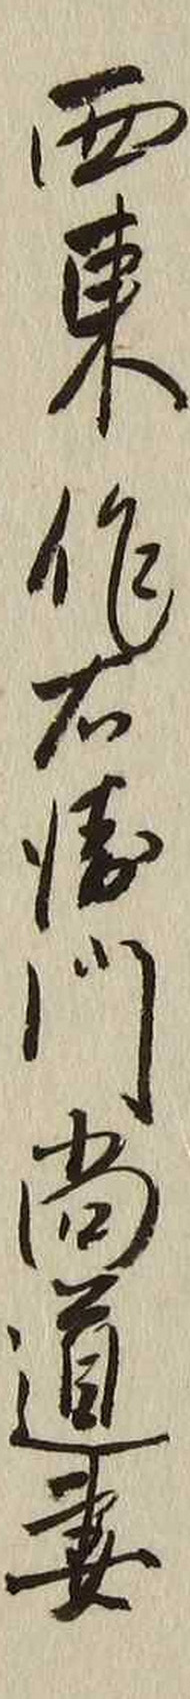女西東作右衛門尚道妻
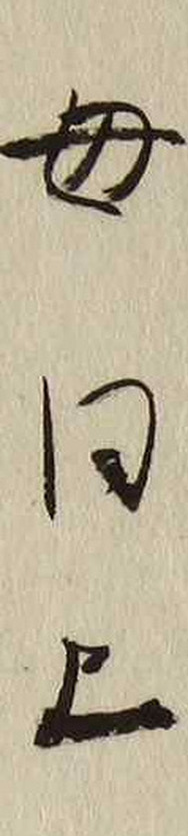母同上
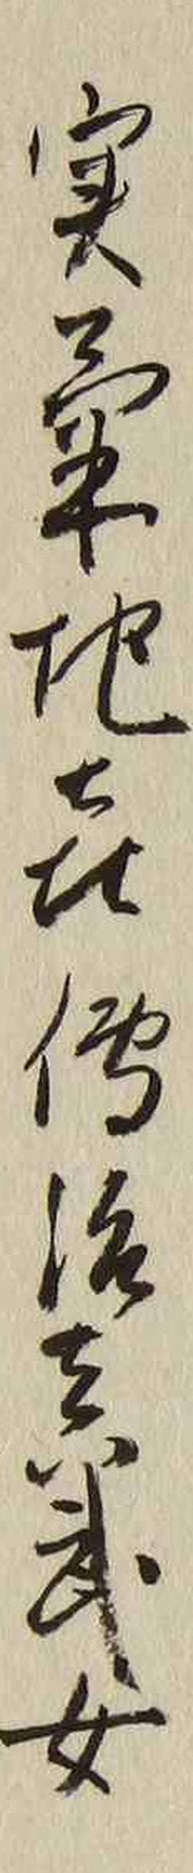実菊地喜伝治真武女

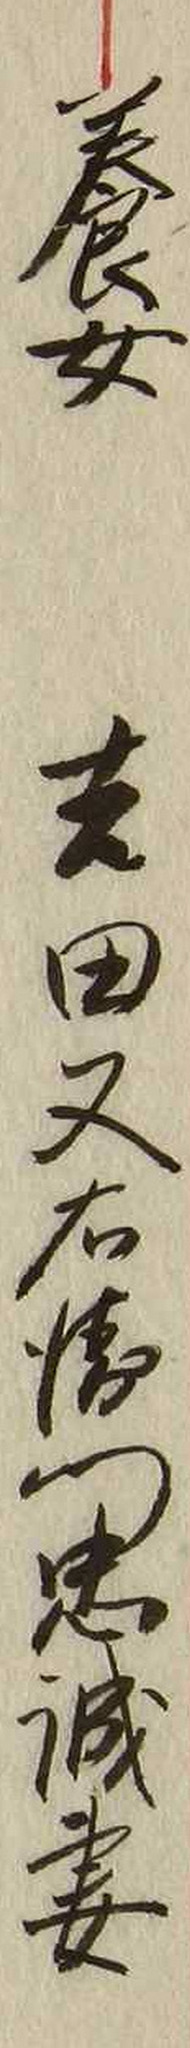養女吉田又右衛門忠誠妻
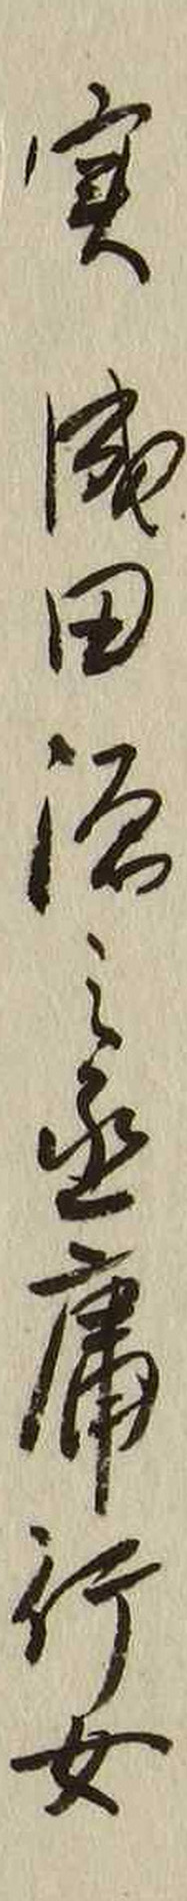実成田源之丞庸行女
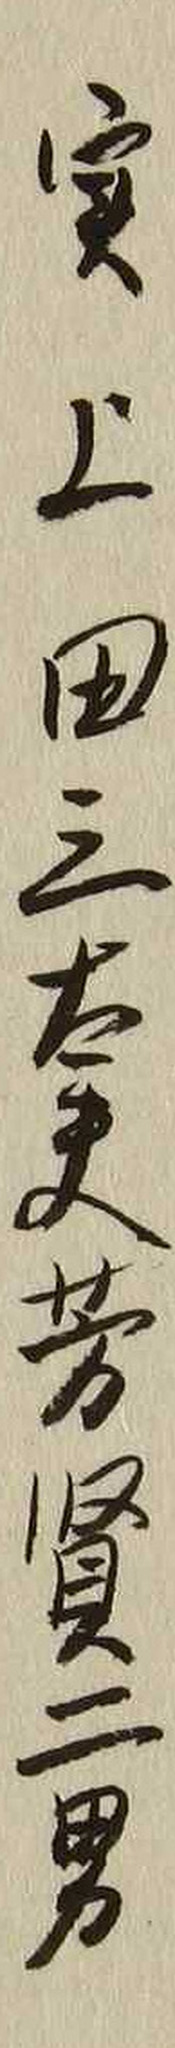実上田三太夫芳賢二男
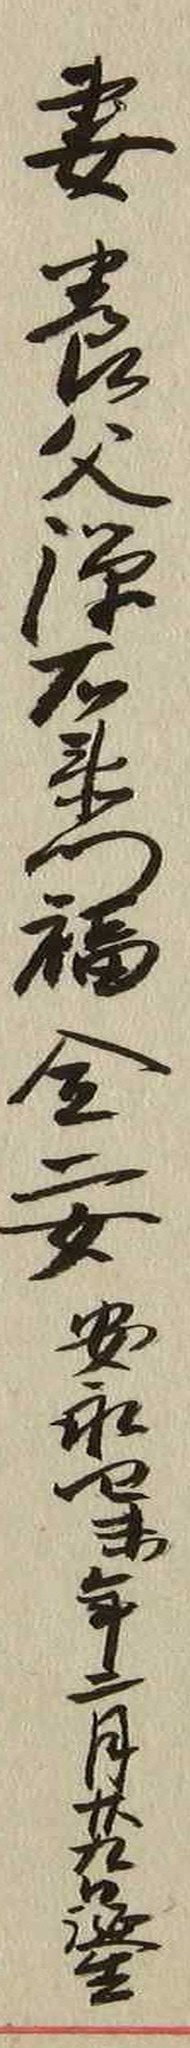妻養父弾右衛門福全二女安永四未年二月廿九日誕生
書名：諸士系譜　巻之346　も之部2
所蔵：会津若松市立会津図書館
